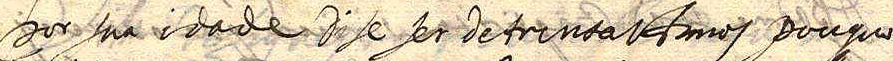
por sua idade dise ser de trinta Annos pouquo
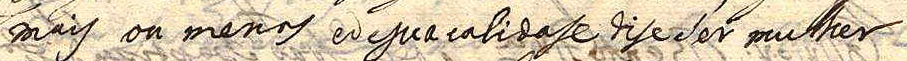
mais ou menos e de sua calidase dise ser mulher
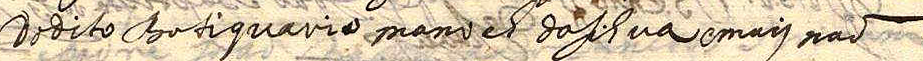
Do dito Botiquario manoel da Silua e mais naõ
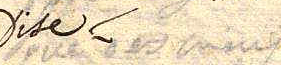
Dise
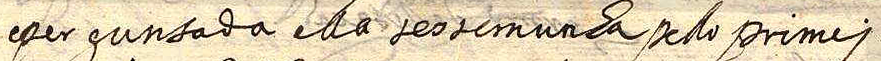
e perguntada ella testemunha pello primej
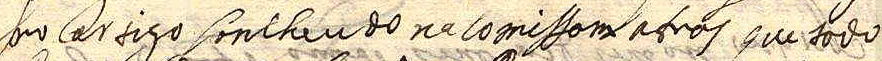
ro artigo Contheudo na comissam atras que todo
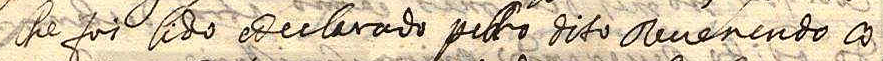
lhe foi lido e declarado pello dito Reuerendo co
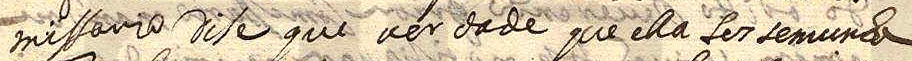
missario dise que verdade que ella testemunha
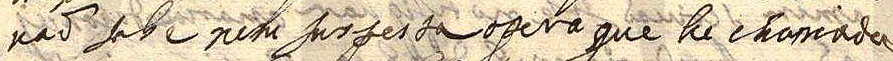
naõ sabe nem suspeita o pera que he chamada
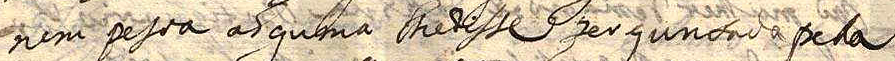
bem pesoa alguma lhe disse perguntada pela
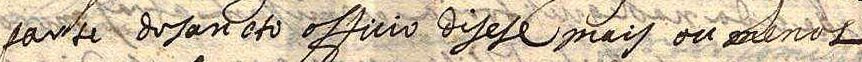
parte do sancto officio disese mais ou menos
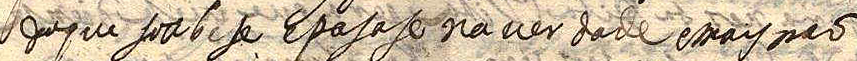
do que soubese e pasase na verdade e mais naõ
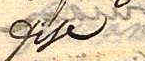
dise
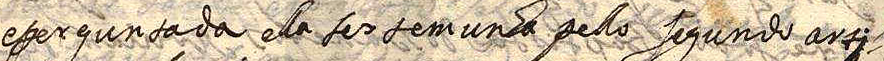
e perguntada ella testemunha pello segundo arti
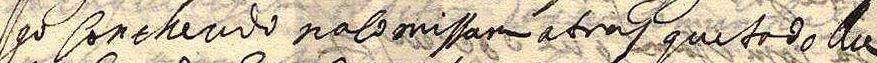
go Contheudo na Comissam atras que todo
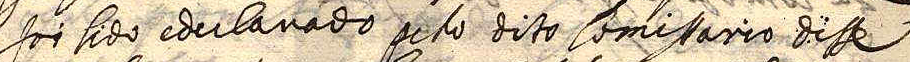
foi lido e declarado pelo dito Comissario disse
